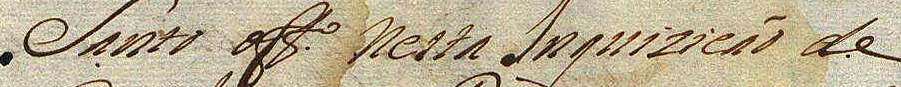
Santo off.o nesta Inquizicaõ de
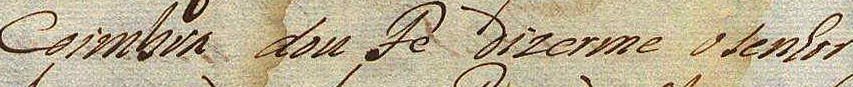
coimbra dou Fe dizerme o senhor
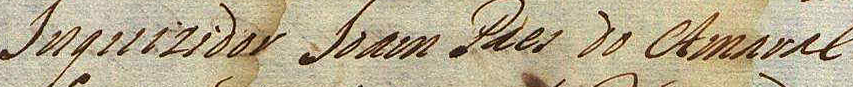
Inquizidor Ioam Paes do Amaral
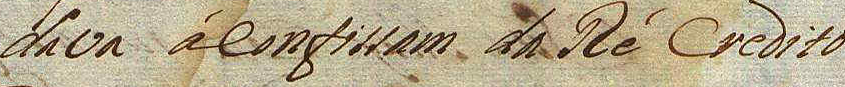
dava á confissam da Ré credito
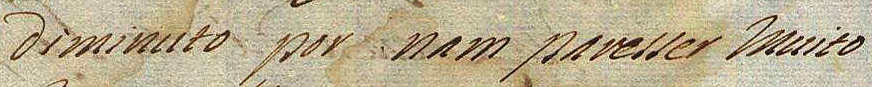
diminuto por nam paresser muito
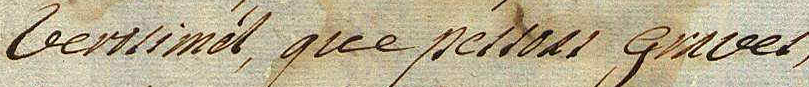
verosimél, que pessoas graves,
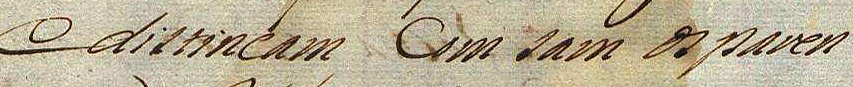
e distincam, com sam os paren
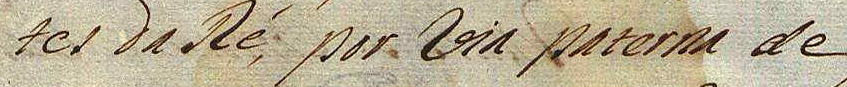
tes da Ré, por via paterna de
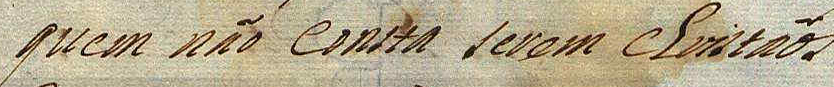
quem não consta serem christaõs
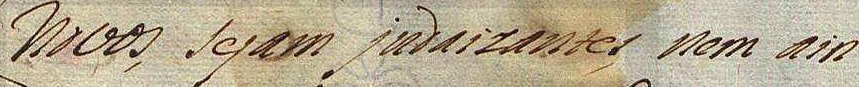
novos, sejam judaizantes, nem ain
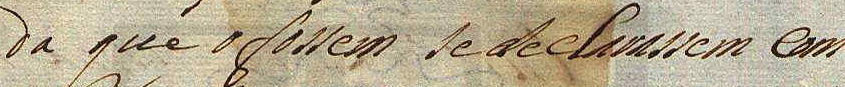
da que o fossem se declarassem com
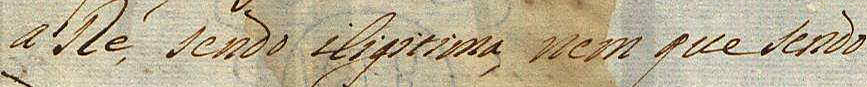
a Ré, sendo iligitima, nem que sendo
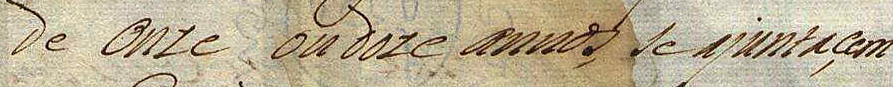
de onze ou doze annos, se ajuntaçem
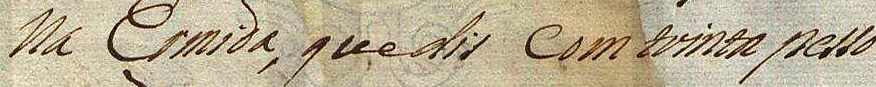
na Ermida, que dis com trinta pesso
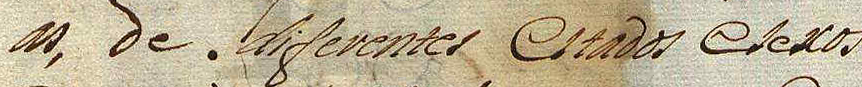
as, de diferentes estados e sexos
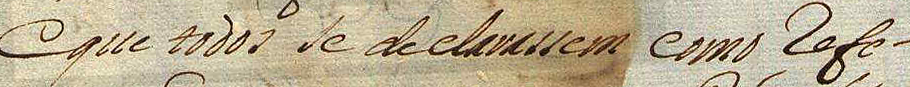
e que todos se declarassem como Refe
